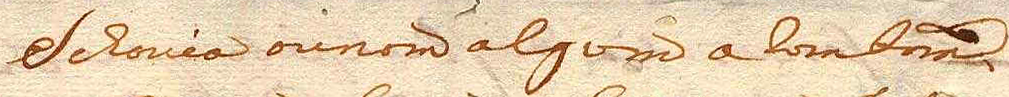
Se hauia, ou nam algum aRombamto,
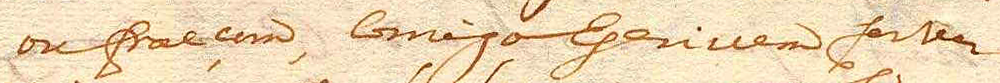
ou fracçam, Comigo Escriuam fes ves
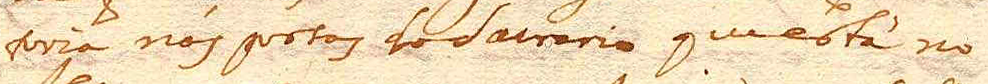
toria nas portas do Sacrario que está no
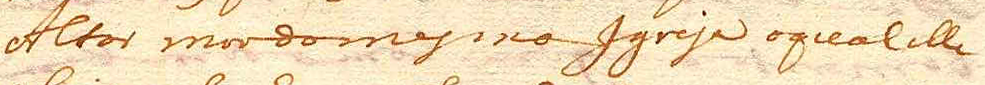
Altar mor da mesma Jgreja o qual elle
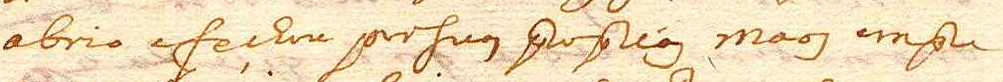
abrio e fechou por suas pRopRias maos em pRe
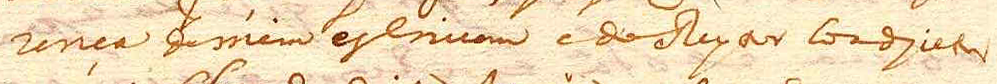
zença de mim escriuam e do Reytor coadjutor
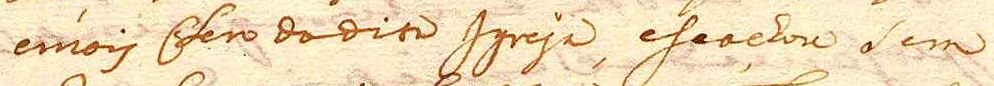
e mais Clero da dita Jgreja, e se achou sem
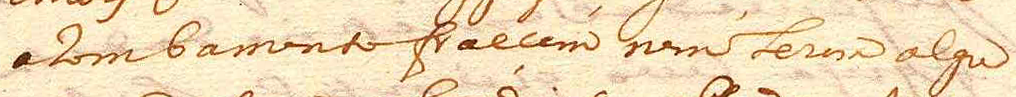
aRombamento fracçam nem Lezura algu
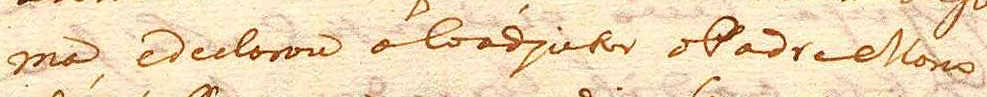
ma, e declarou o Coadjutor o Padre Mano
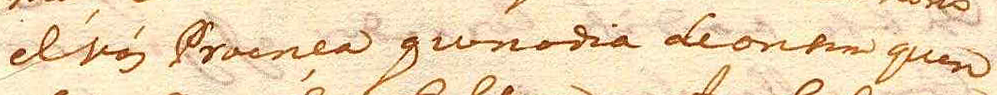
el vás Proença que no dia de ontem quan
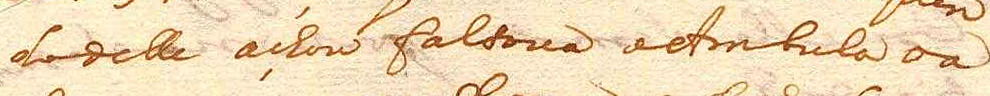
do delle achou faltaua a Ambula o a
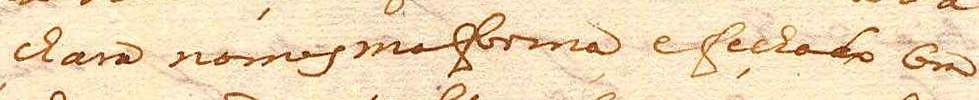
chara na mesma forma e fechado com
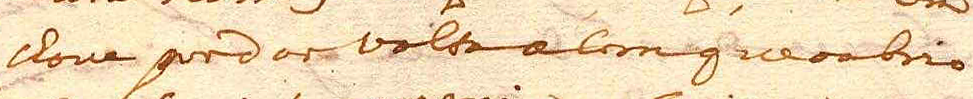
chaue por dar volta a com que o abrio
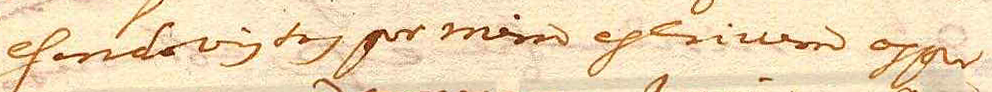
e sendo vistas por mim escriuam as por
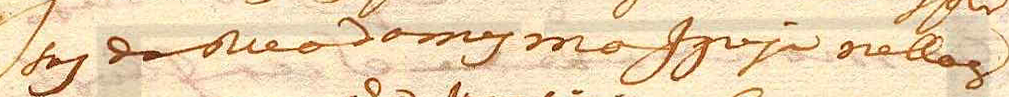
tas da Rua da mesma Jgreja nellas
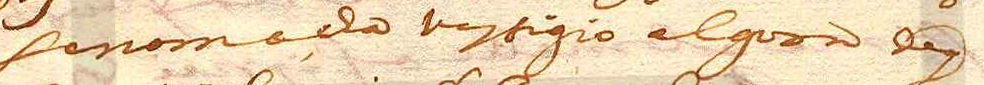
se nam acha vestigio algum de q̄
